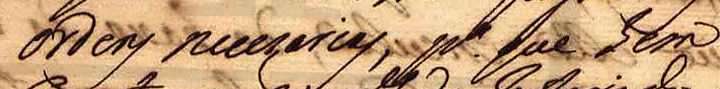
ordens necesarias, p.a que bem
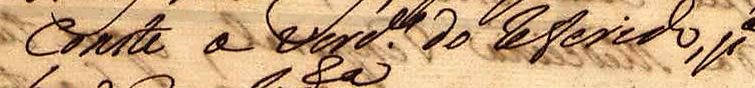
conste a verd.e do Referido, p.a
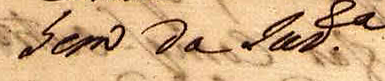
bem da Ius.ça
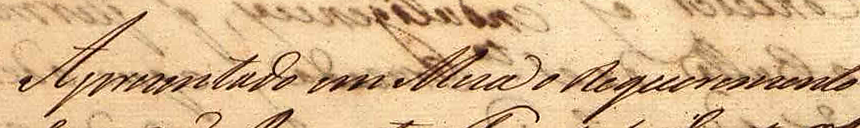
Aprezentado em Meza o Requeremento
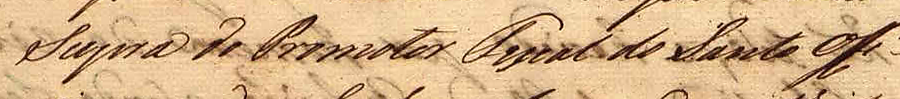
Supra do Promotor Fiscal do Santo Offi
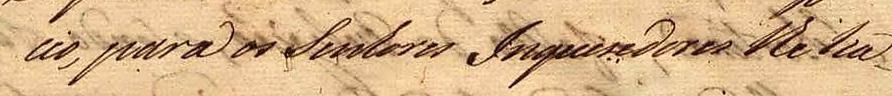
cio, para os Senhores Inquisidores lhe ha
